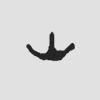山
